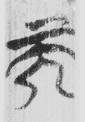而
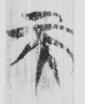天
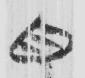目
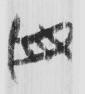母
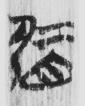{𡰥目}
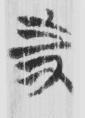寺
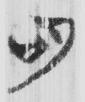名
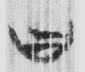曰
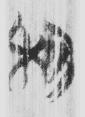利
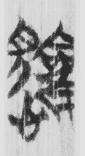{觀心}
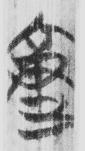{亯京止}
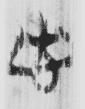悤
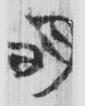明
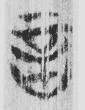音
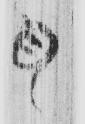色
